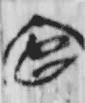倌
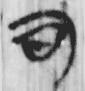司
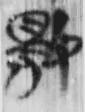敗
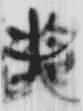若
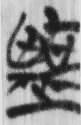○（盬）
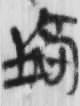塙
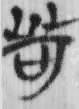苛
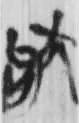狗
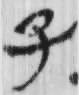子
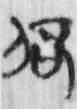卲
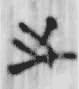之
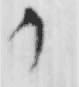人
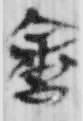舒
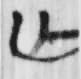亡
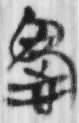愄
